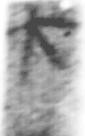大
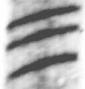三
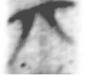亓（其）
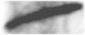一
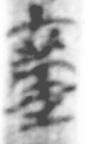𨍱（乘）
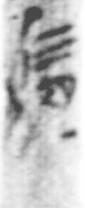駟
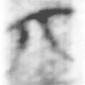亓（其）
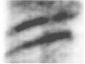二
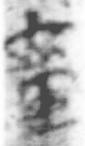𨍱（乘）
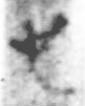屯
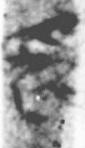麗
